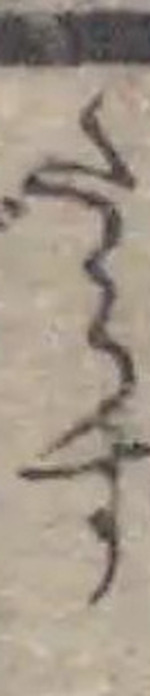たらず
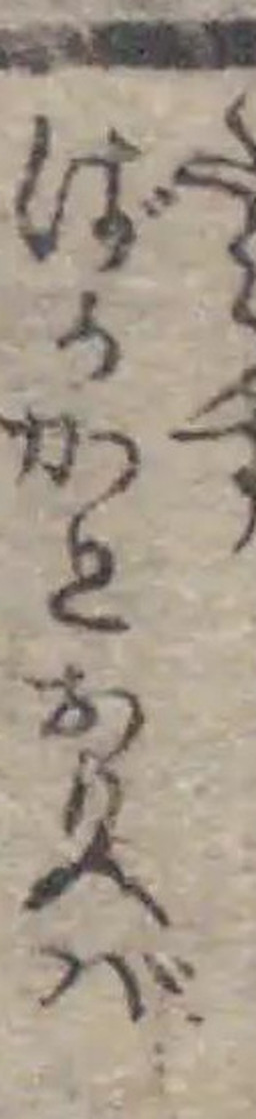ばかかとおもへば
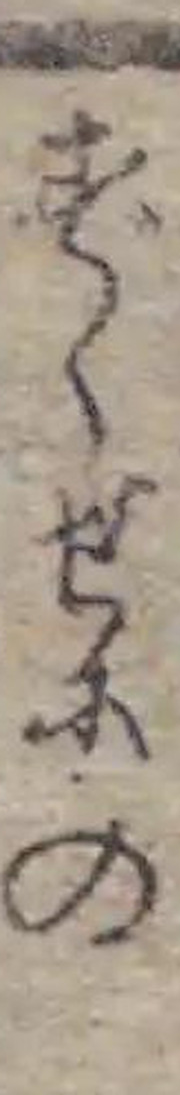すくぜにの
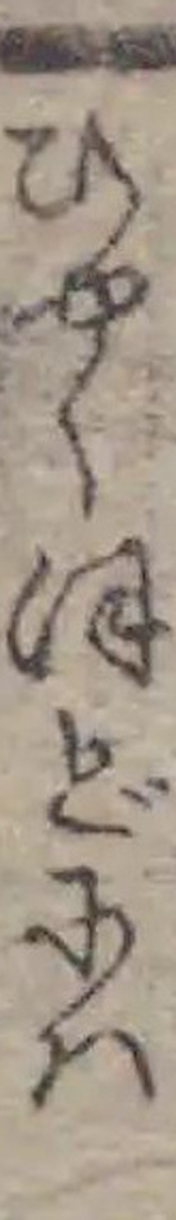ひやくほどには
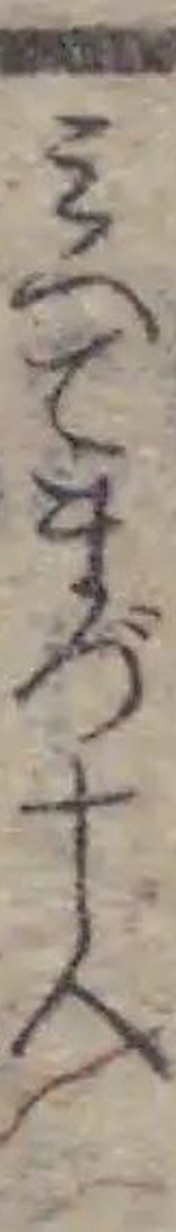みへてまづ十人
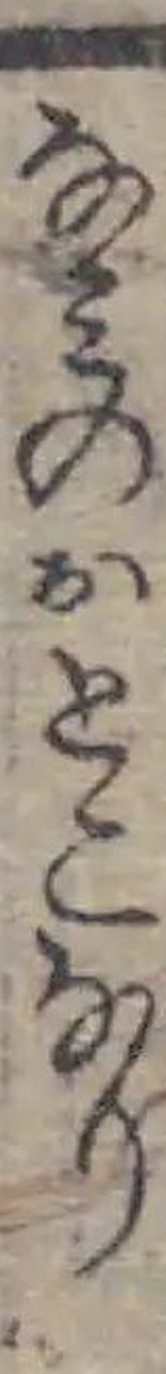なみのおとこなり
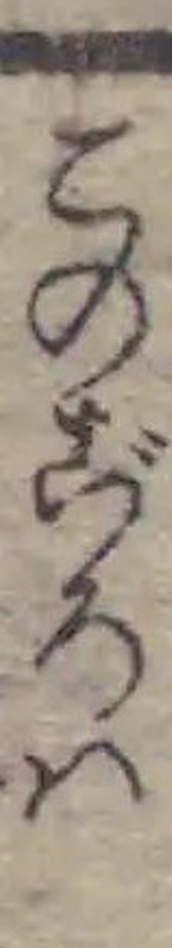このごろは
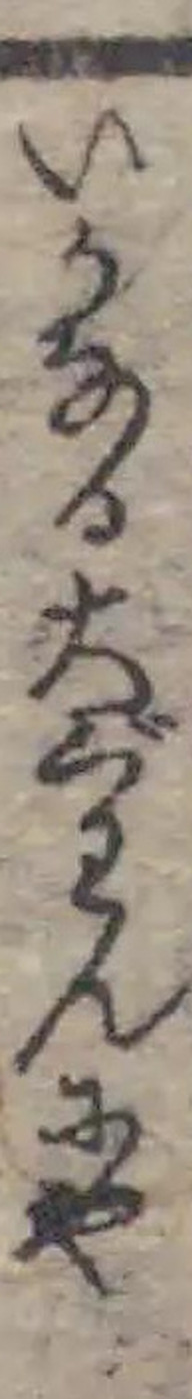いかなる大ぐわんにや
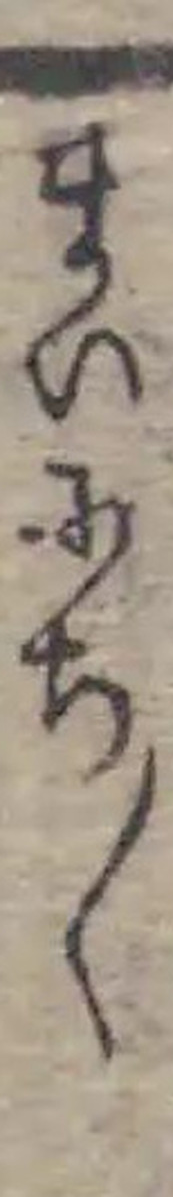まいにち〳〵
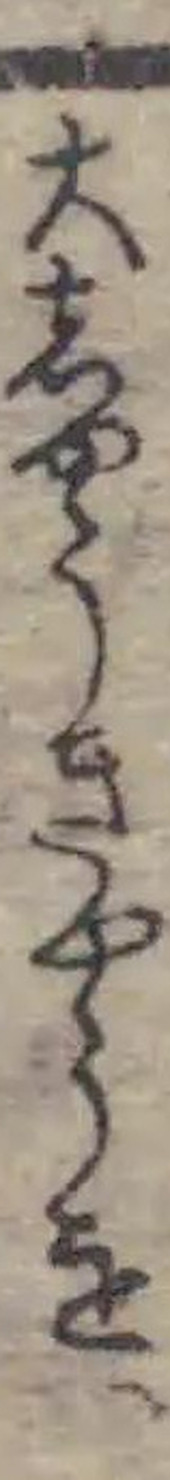大しやうきやうを
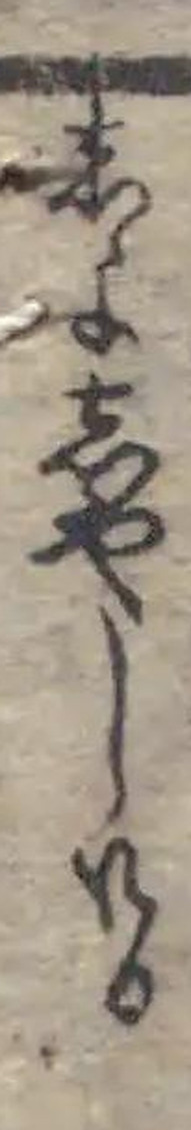しよしやしける
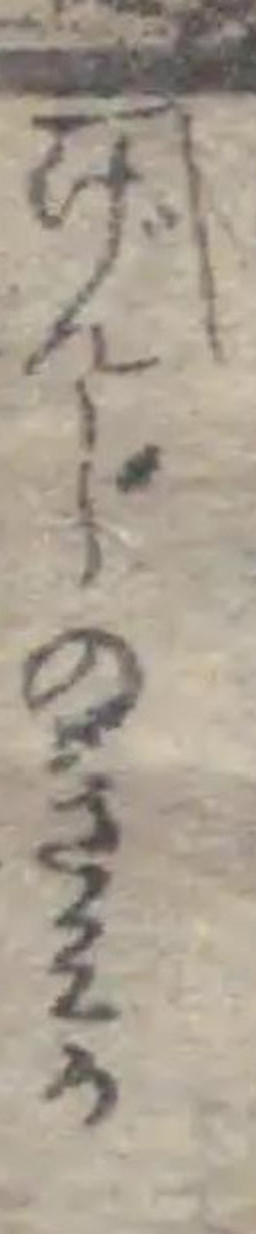〽げんじのきみか
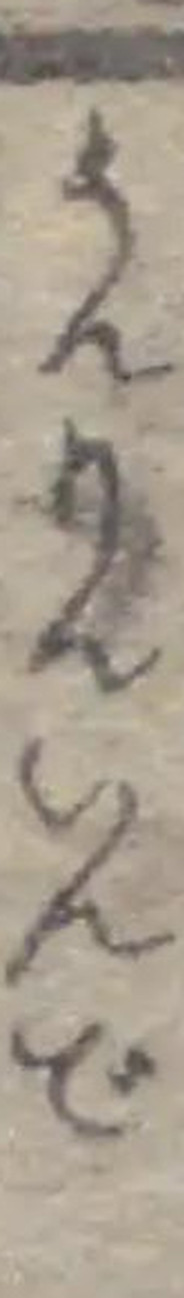うんりんいんで
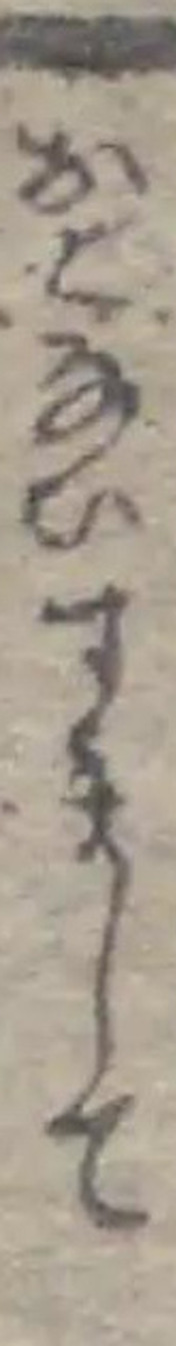おこないすまして
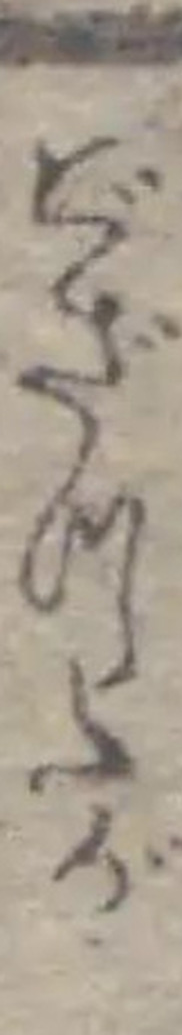ござつたが
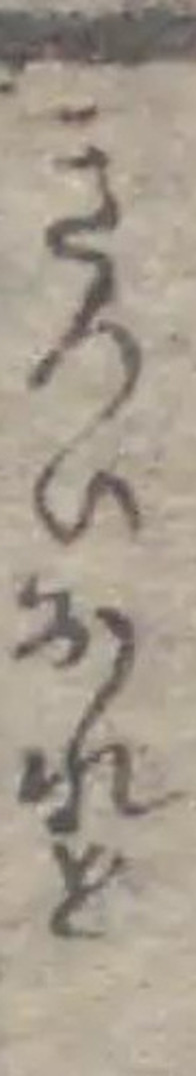きついおれと
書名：福壽海旡量品玉 3巻
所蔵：国立国会図書館 National Diet Library, JAPAN
